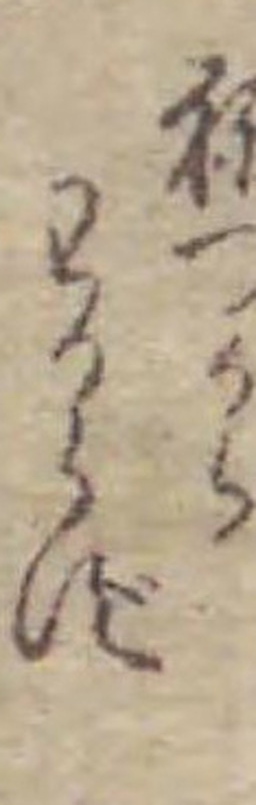わからず
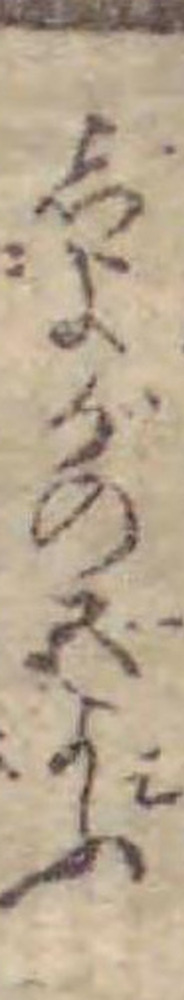しよがの五よふ
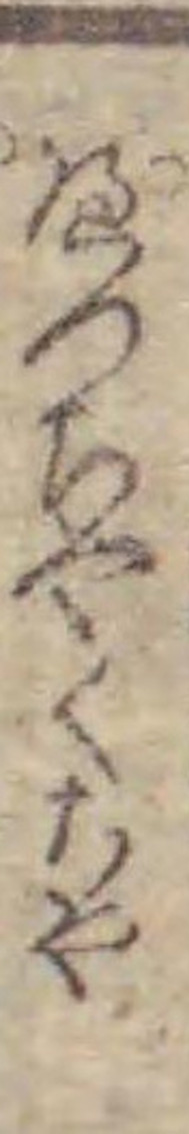ぺつちやくちや
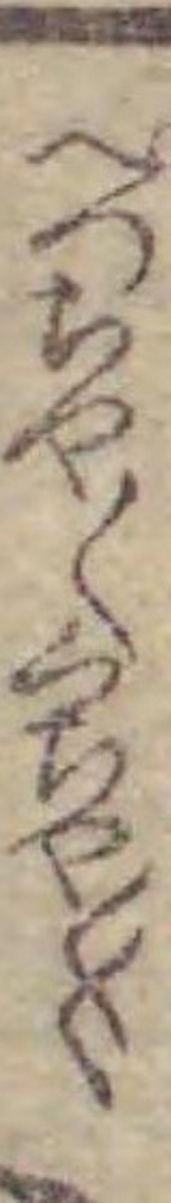ぺつちや〳〵くちや〳〵〳〵
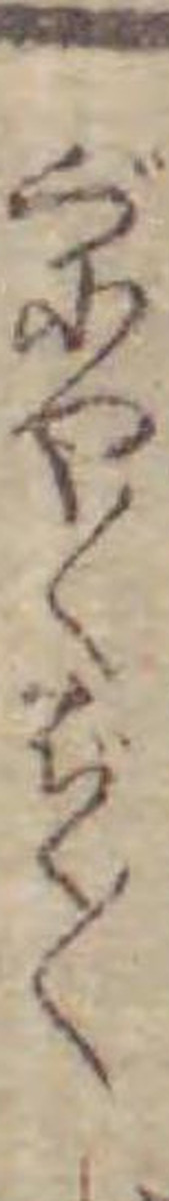ぐにや〳〵ばく〳〵
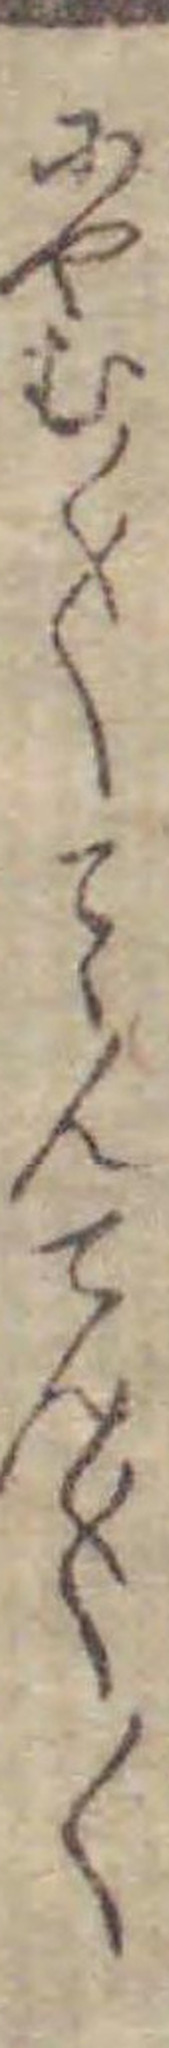にやむ〳〵〳〵てゝんてん〳〵〳〵〳〵
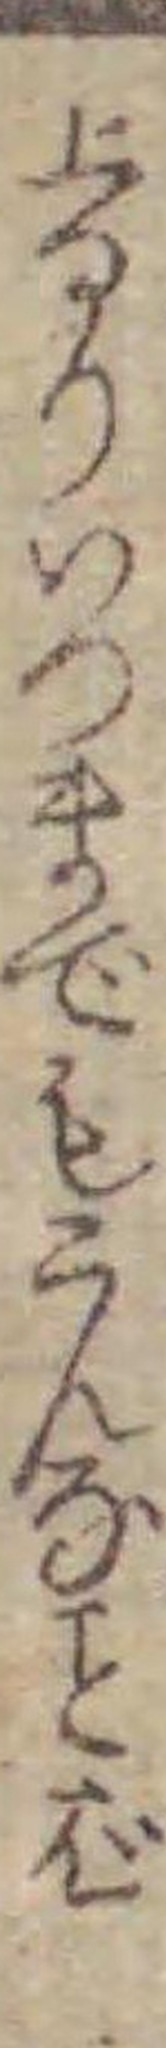上るりいつまでもこんなことば
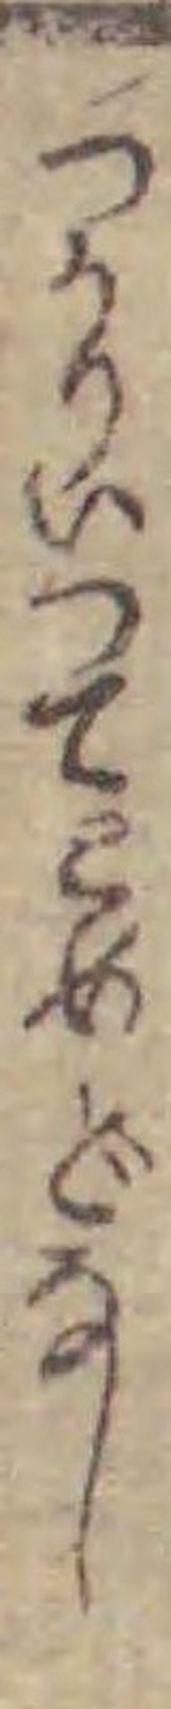つかりいつてとめどなし

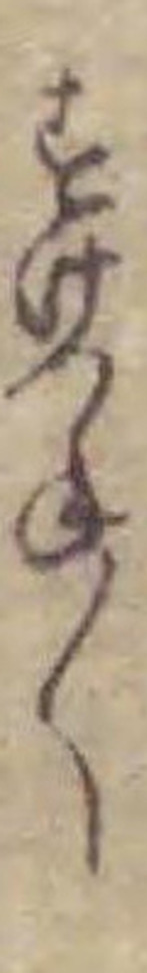すけつね〳〵
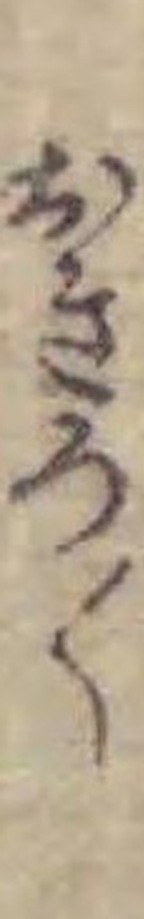おきろ〳〵
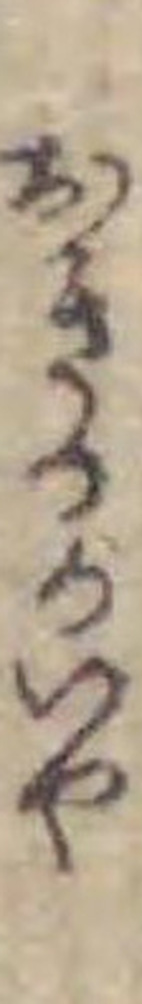おきるかいや
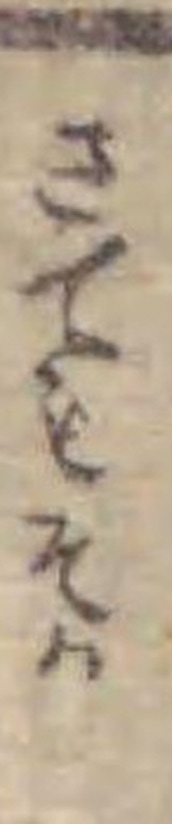さてもそか
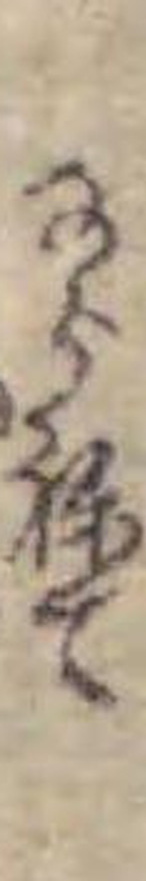ならねて
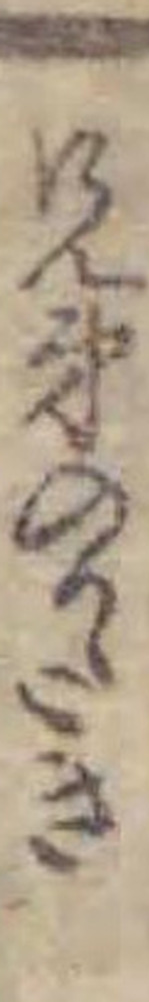兄弟のかたき
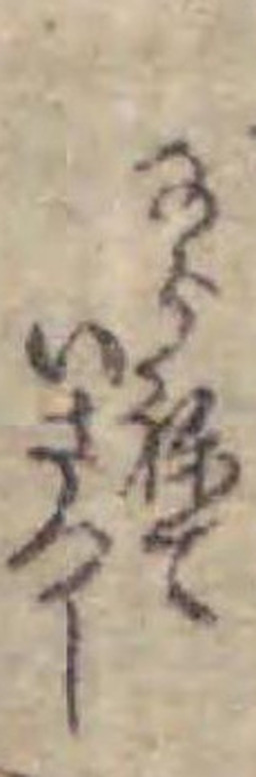いさつし
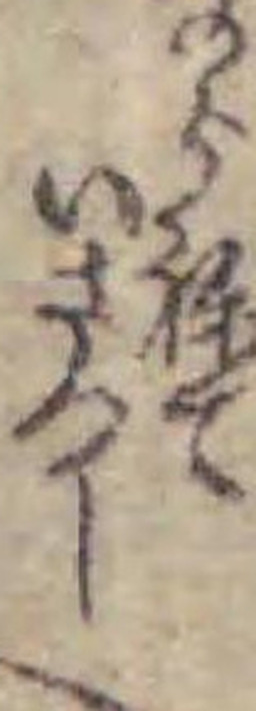いさつし
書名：年寄之冷水曽我 : 3巻
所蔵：国立国会図書館 National Diet Library, JAPAN
